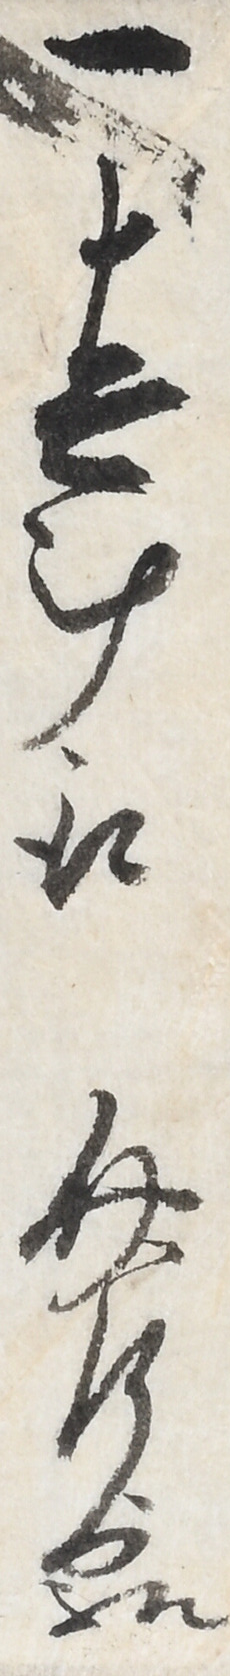一十六斗取丹左衛門
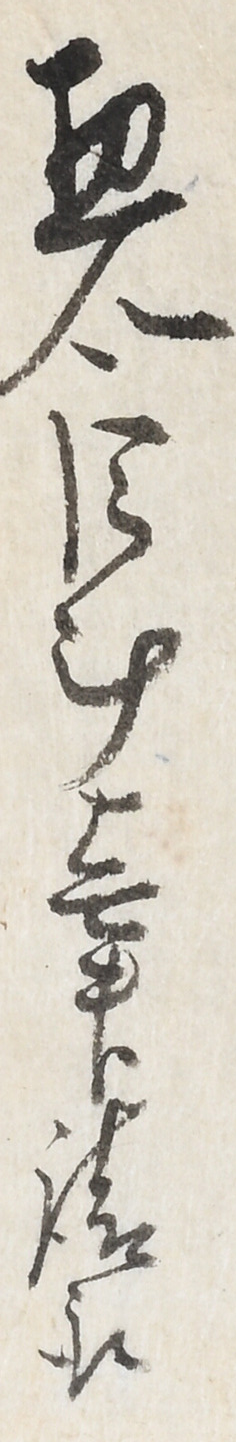惣合四斗壱升請取
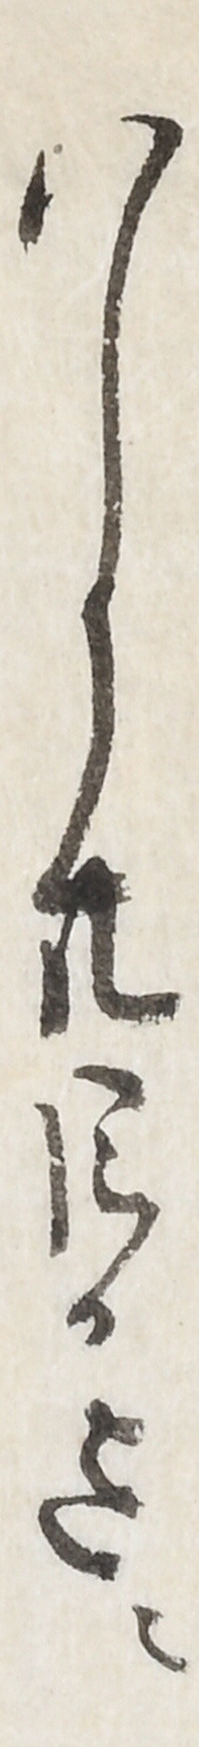八月廿四日迄也
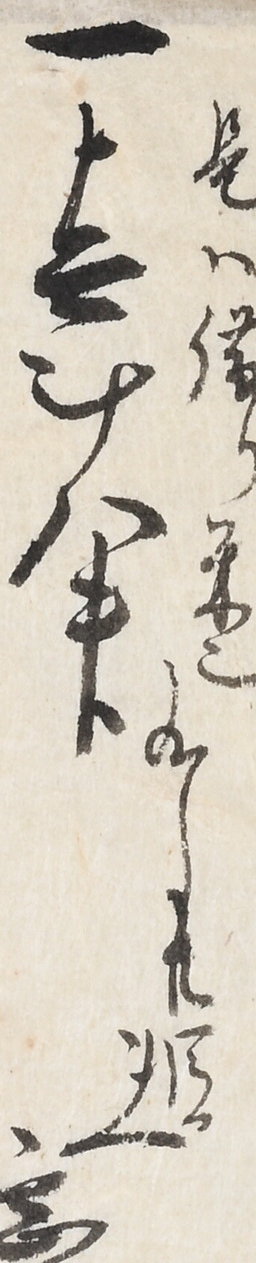一壱斗八升甚松
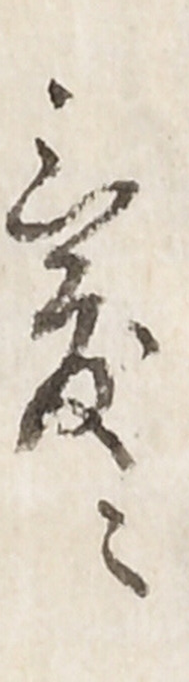三度〃
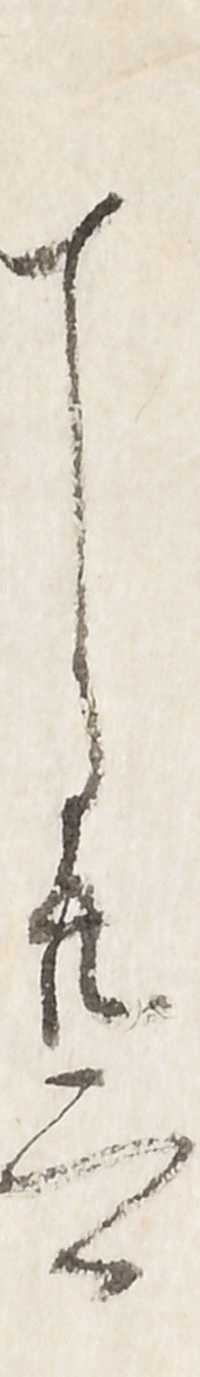十月廿二日

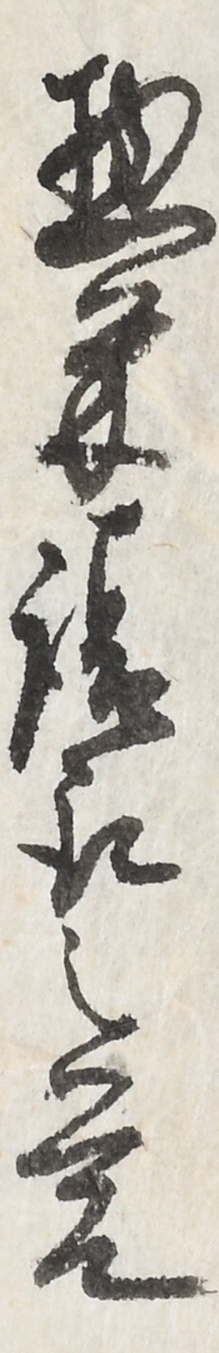惣米請取之覚
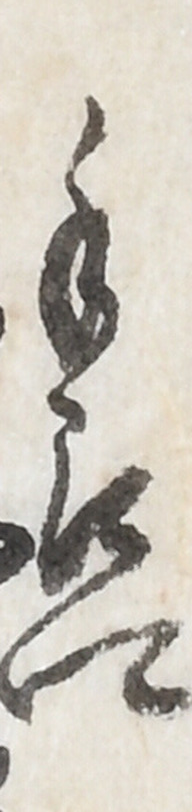手良郷
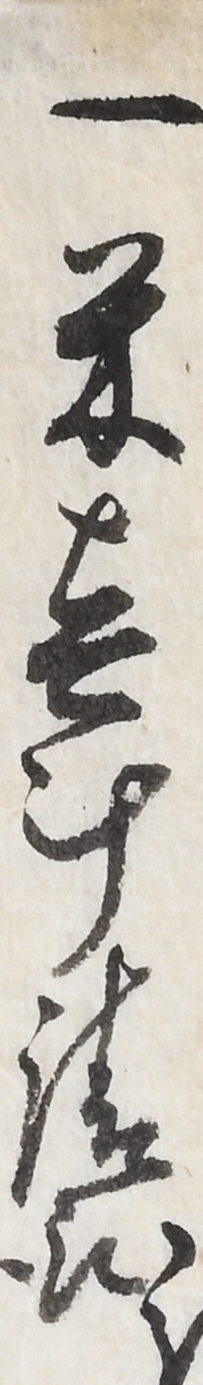一米壱斗請取
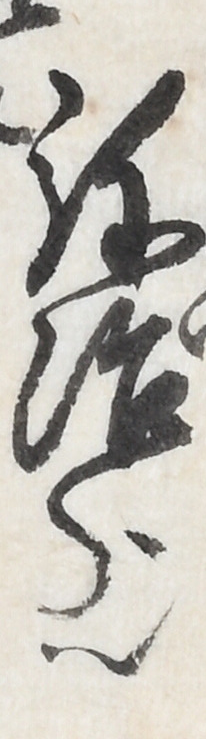弥治郎殿
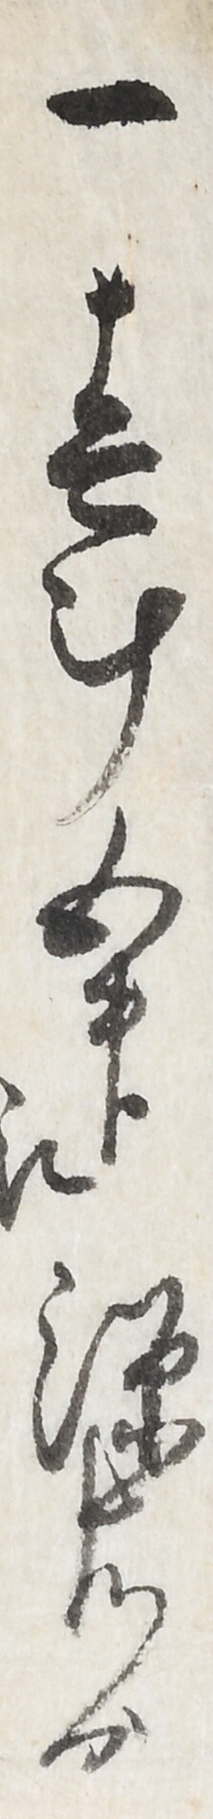一壱斗五升取源右衛門
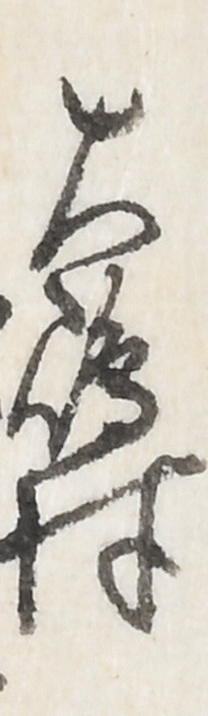大嶋村
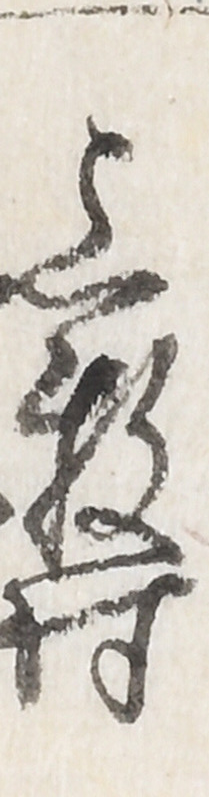上牧村
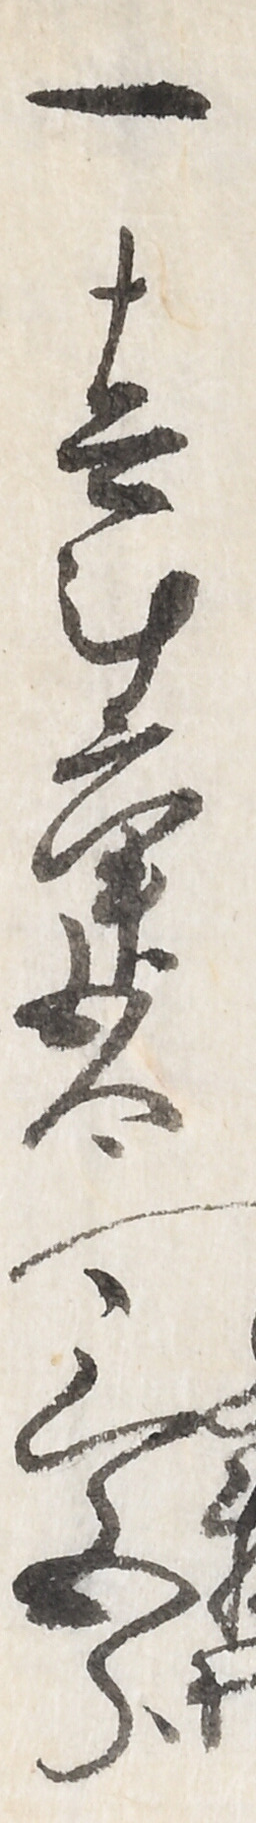一壱斗六升五合三五郎
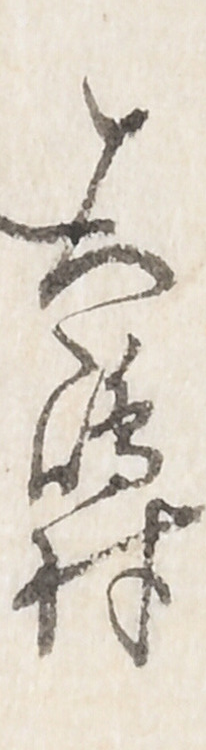大嶋村
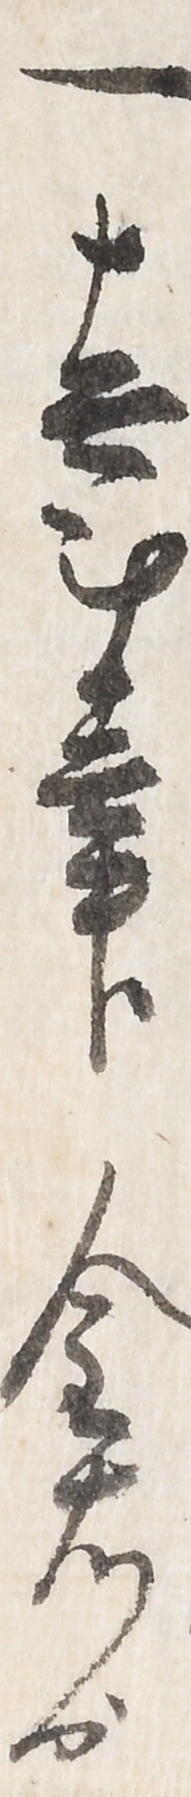一壱斗壱升金右衛門
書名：合力覚帳
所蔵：伊那市立高遠町図書館・合同会社AMANE
